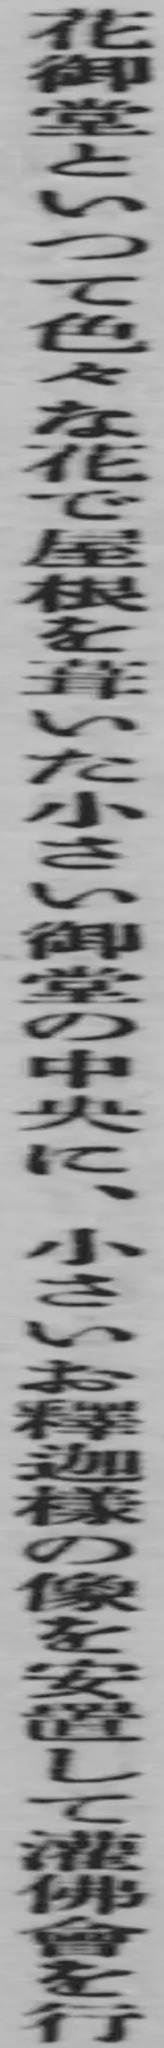花御堂といつて色々な花で屋根を葺いた小さい御堂の中央に、小さいお釋迦様の像を安置して灌佛會を行
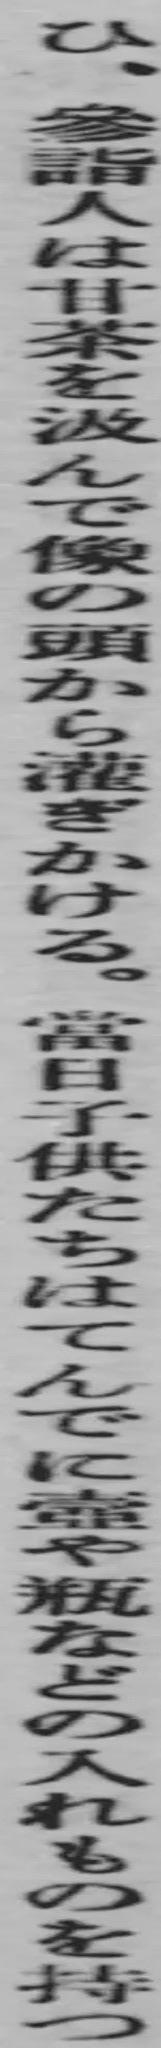ひ、參詣人は甘茶を汲んで像の頭から灌ぎかける。當日子供たちはてんでに壺や瓶などの入れものを持つ
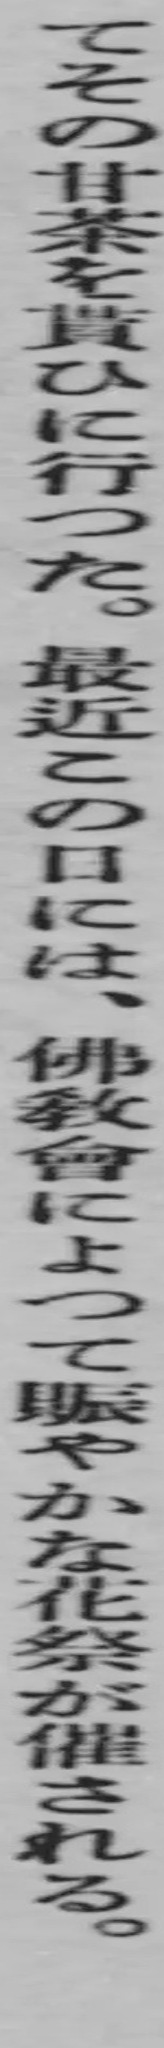てその甘茶を貰ひに行つた。最近この日には、佛敎會によつて賑やかに花祭が催される。
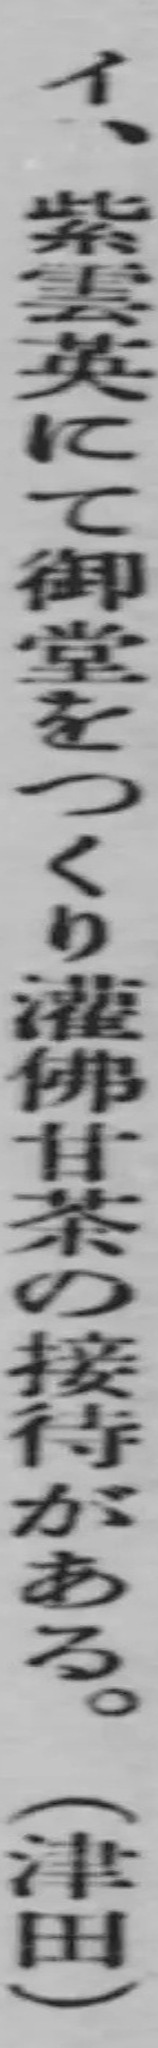イ、紫雲英にて御堂をつくり灌佛甘茶の接待がある。(津田)
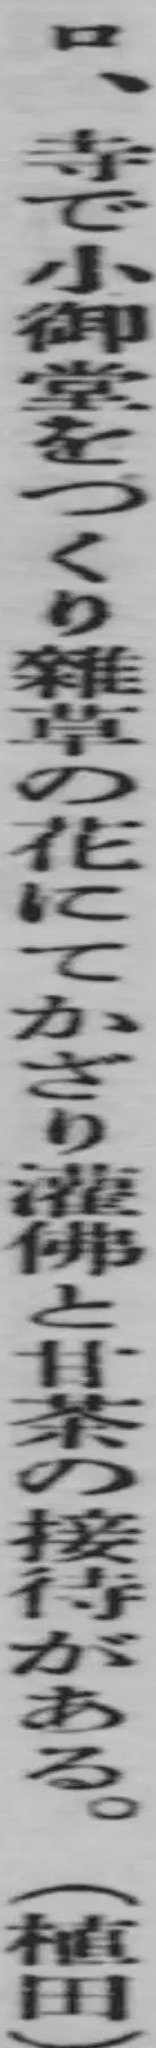ロ、寺で小御堂をつくり雜草の花にてかざり灌佛と甘茶の接待がある。(植田)
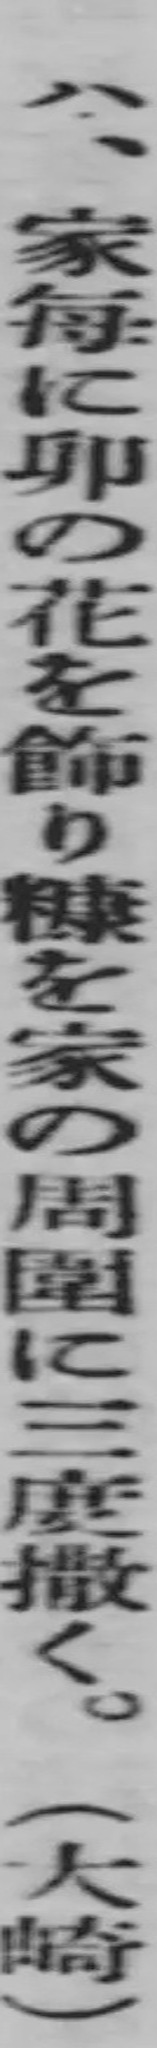ハ、家每に卯の花を飾り糠を家の周圍に三度撒く。(大崎)
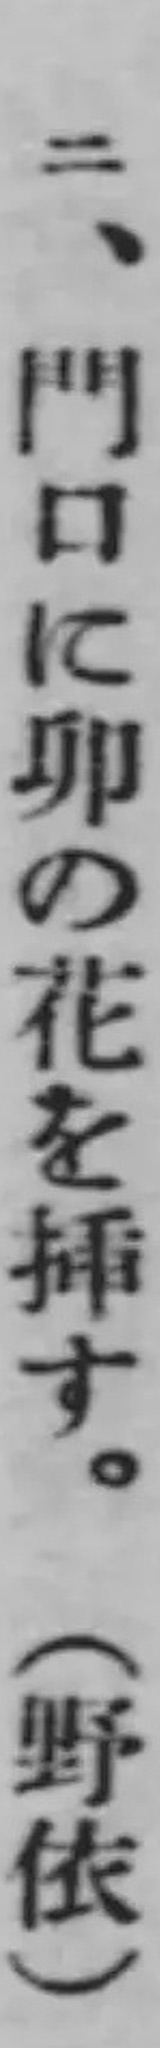ニ、門口に卯の花を挿す。(野依)
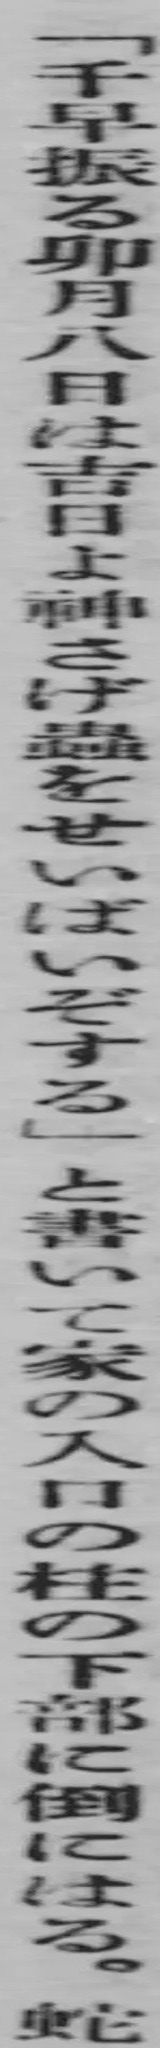「千早振る卯月八日は吉日よ神さげ蟲をせいばいぞする」と書いて家の入口の柱の下部に倒にはる。蛇
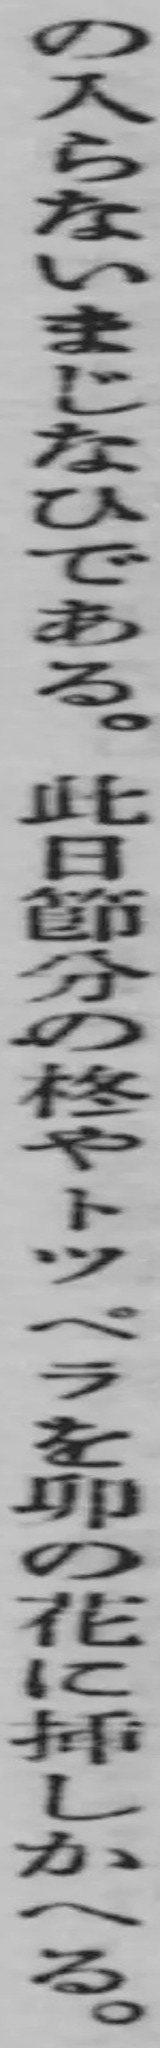の入らないまじなひである。此日節分の柊やトツペラを卯の花に挿しかへる。
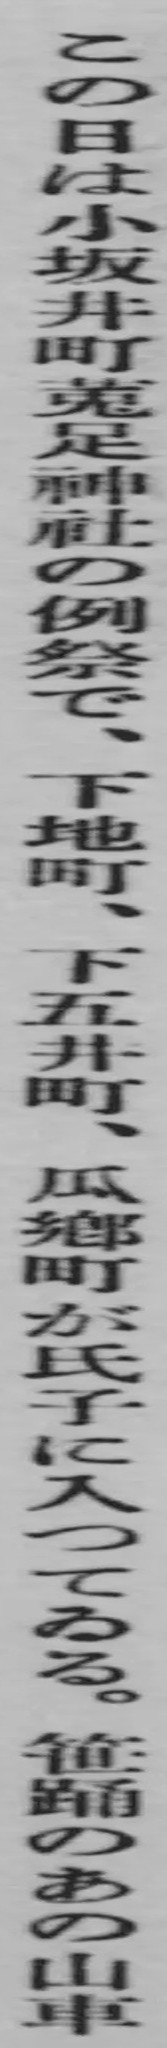この日は小坂井町𫟏足神社の例祭で、下地町、下五井町、瓜鄕町が氏子に入つてゐる。笹踊のあの山車
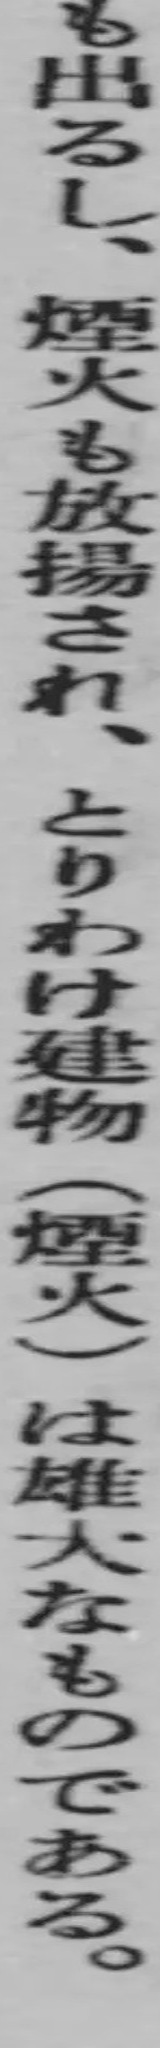も出るし、煙火も放揚され、とりわけ建物(煙火)は雄大なものである。
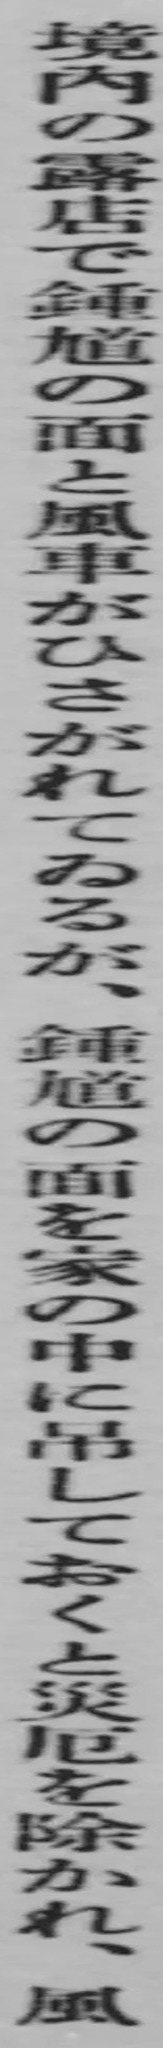境内の露店で鍾馗の面と風車がひさがれてゐるが、鍾馗の面を家の中に吊しておくと災厄を除かれ、風
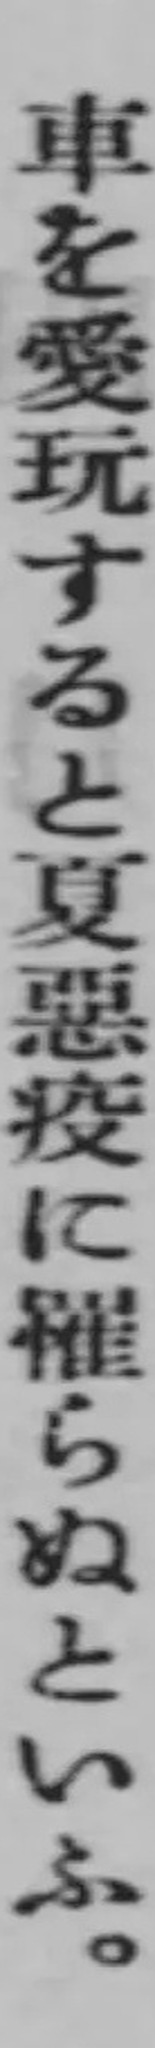車を愛玩すると夏惡疫に罹らぬといふ。
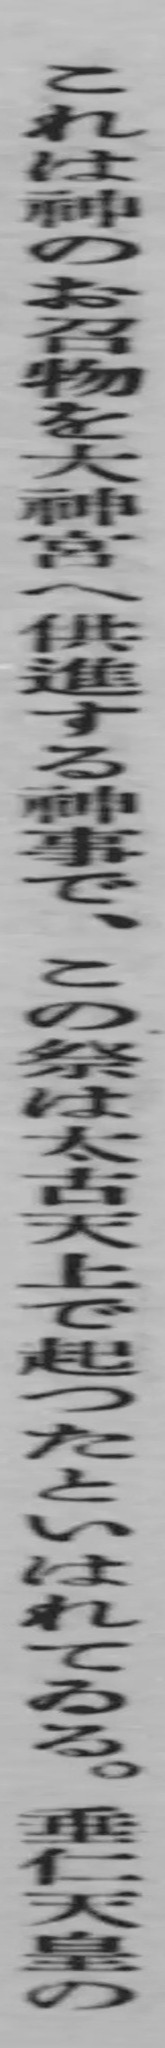これは神のお召物を大神宮へ供進する神事で、この祭は太古天上で起つたといはれてゐる。垂仁天皇の
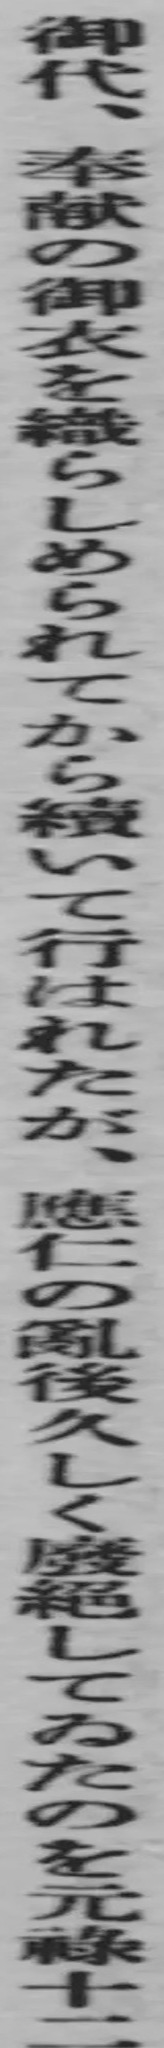御代、奉献の御衣を織らしめられてから續いて行はれたが、應仁の亂後久しく廢絕してゐたのを元祿十二
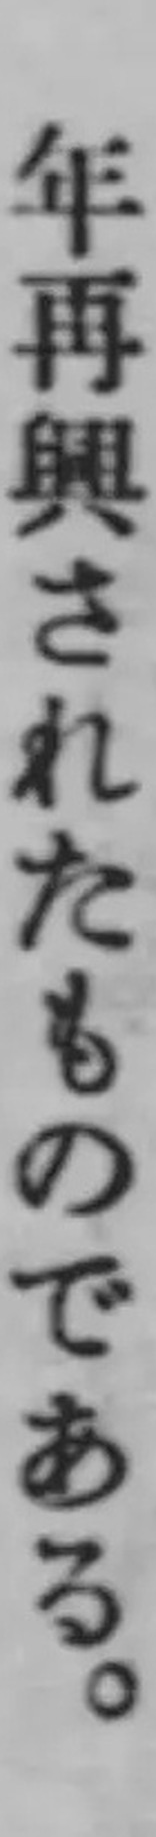年再興されたものである。
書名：豊橋の年中行事
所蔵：国立国会図書館 National Diet Library, JAPAN
